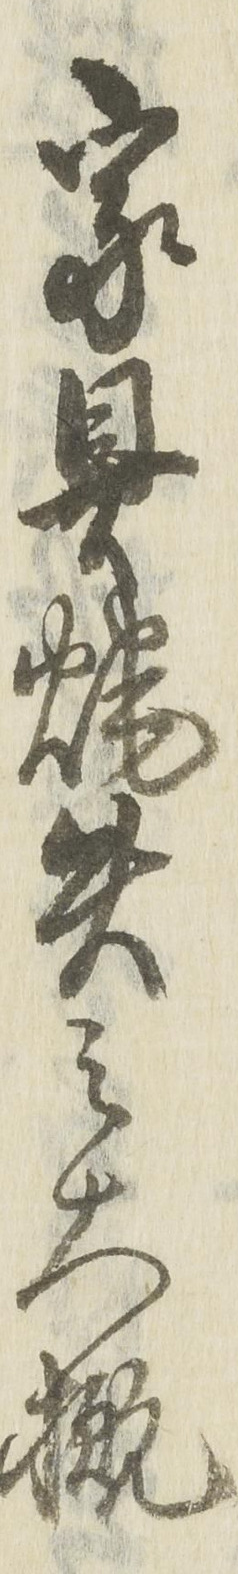家具焼失之大概
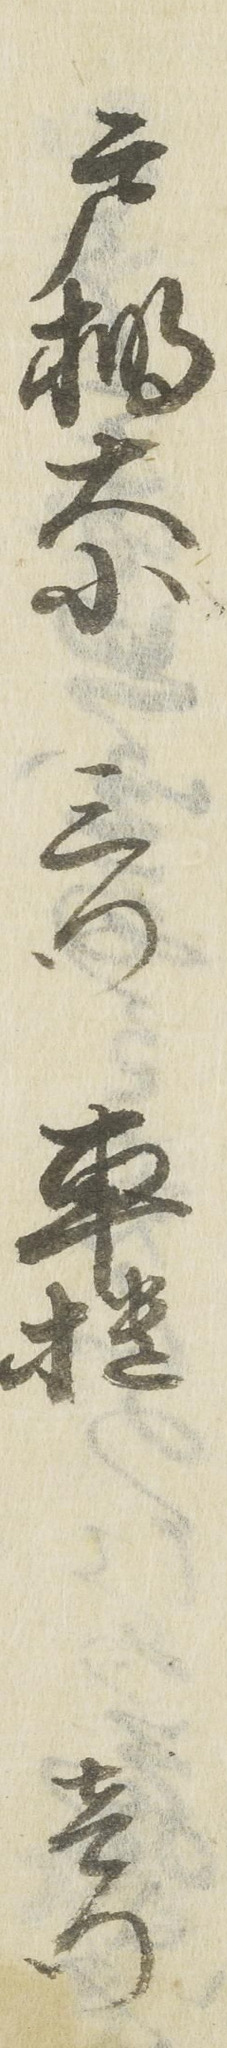戸棚大小三つ車遣壱つ
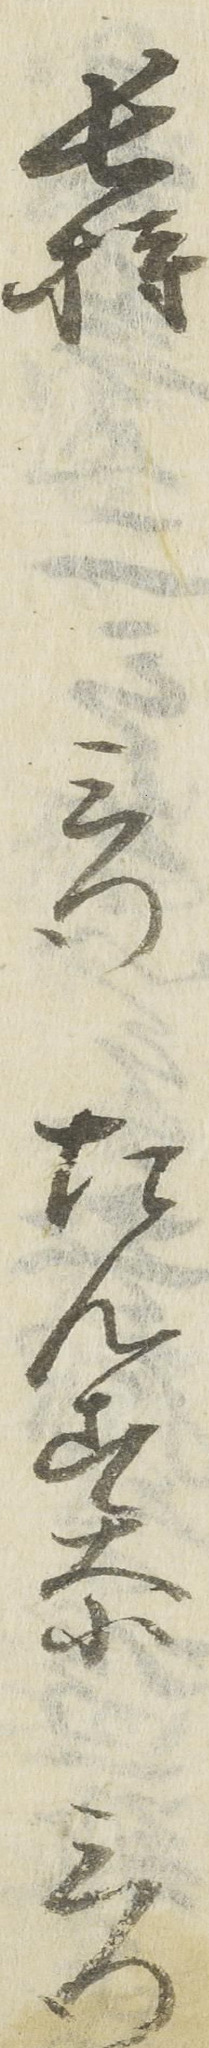長持三つたんす大小三つ
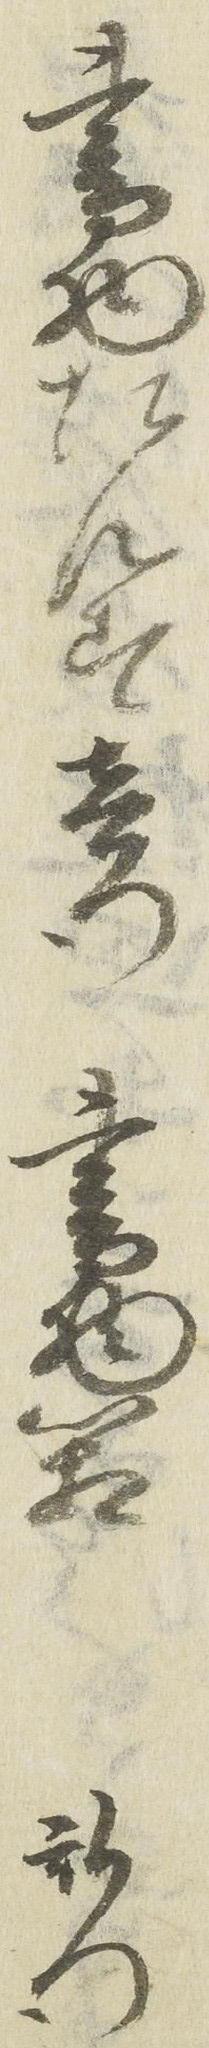書物たんす壱つ書物箱弐つ
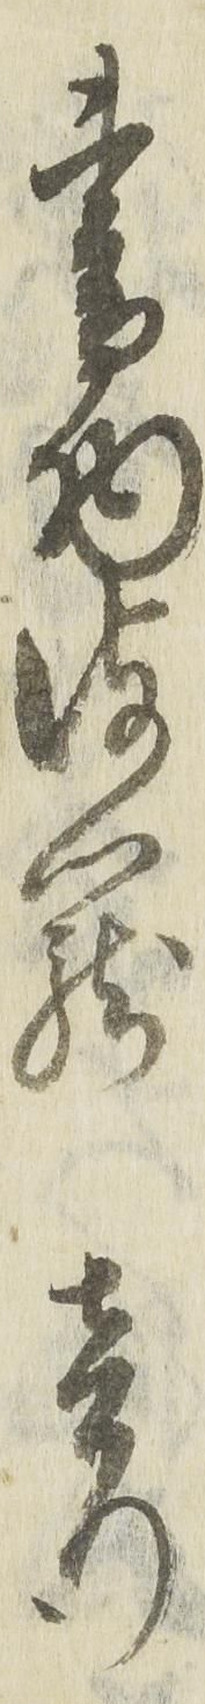書物波籠壱つ
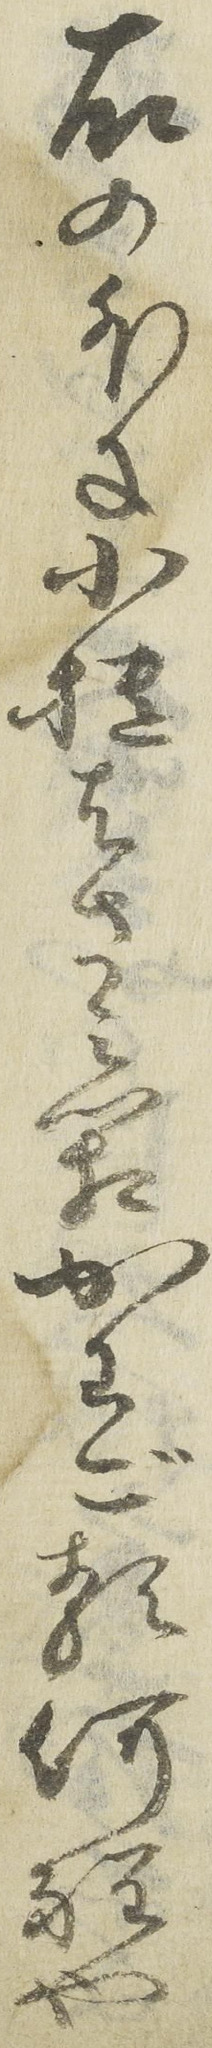右の外に小遣はさみ箱かわご類何程や

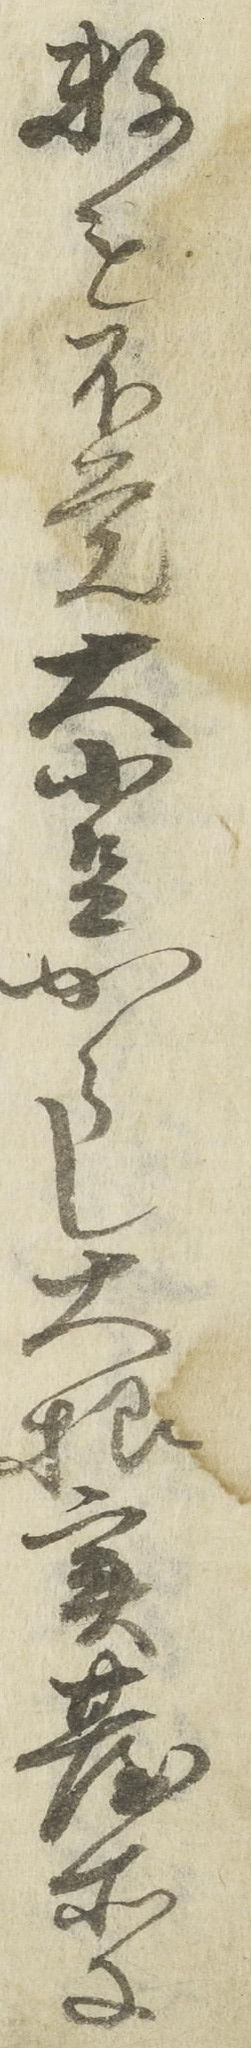数も不覚大小豆からし大根実台所に
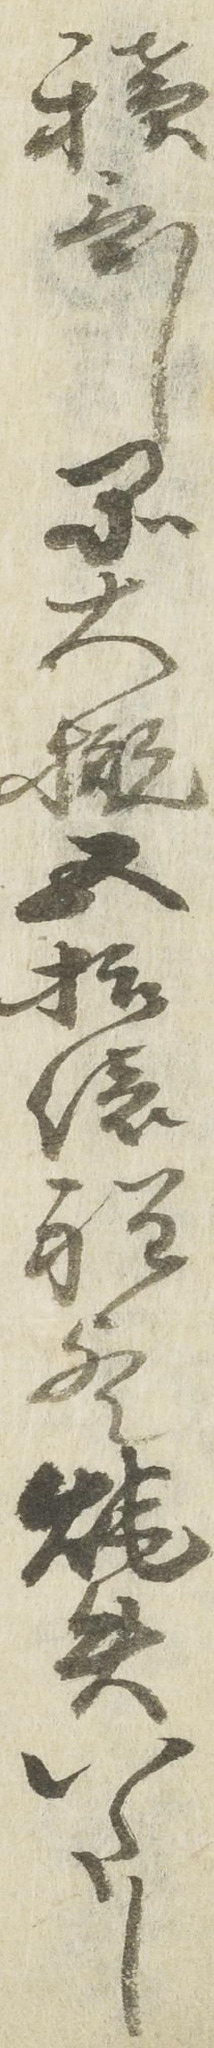積置し品大概五拾俵程歟焼失いたし
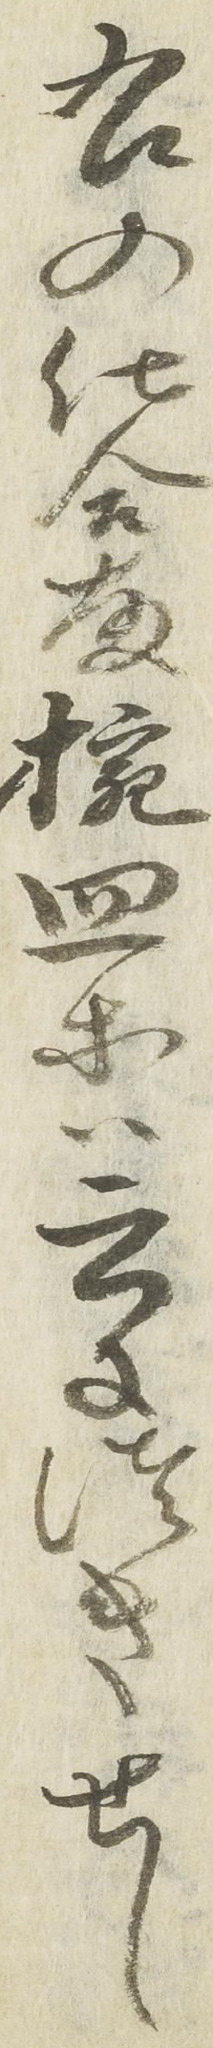右の仕合故椀皿等は云につきせし
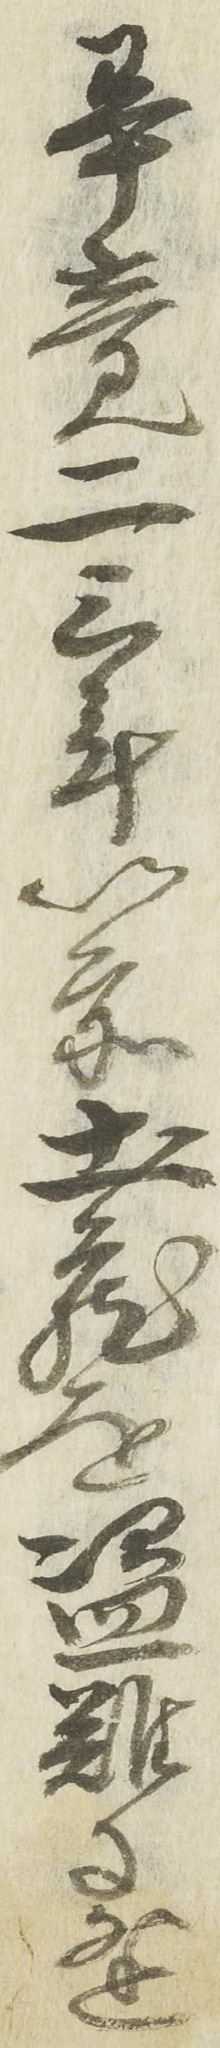畢竟ニ三年以前土蔵を盗難に逢
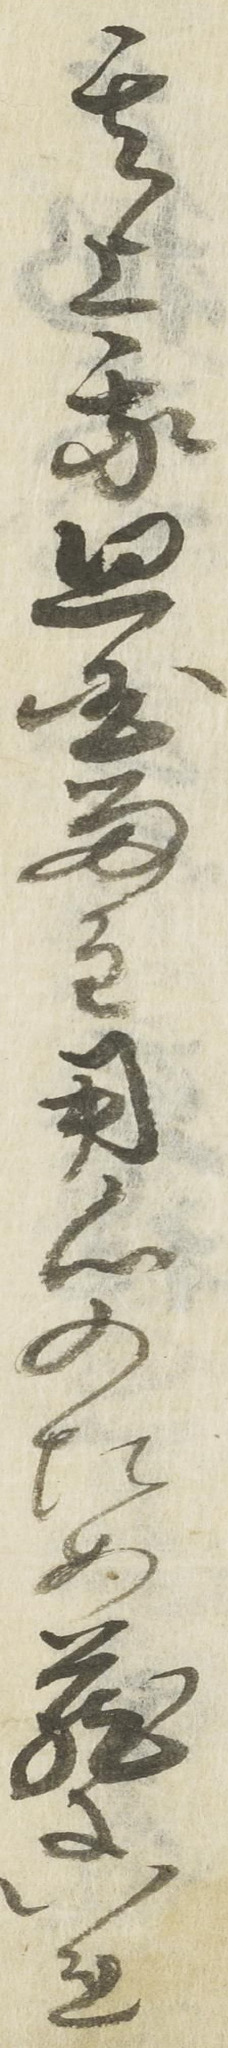其上我廻国当主用心のため蔵にいれ
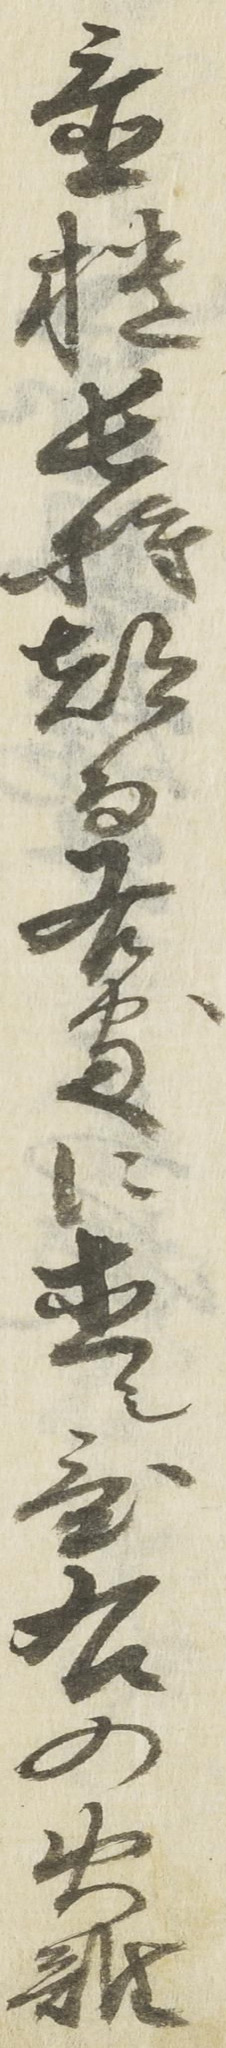置櫃長持都而居敷に直シ置右の火難
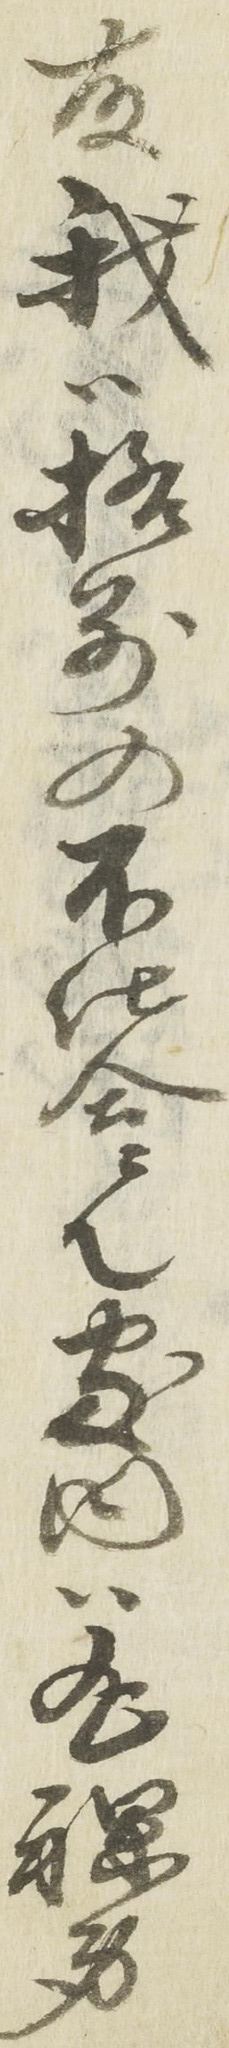故我は格前の不仕合ニて家内は丸裸身
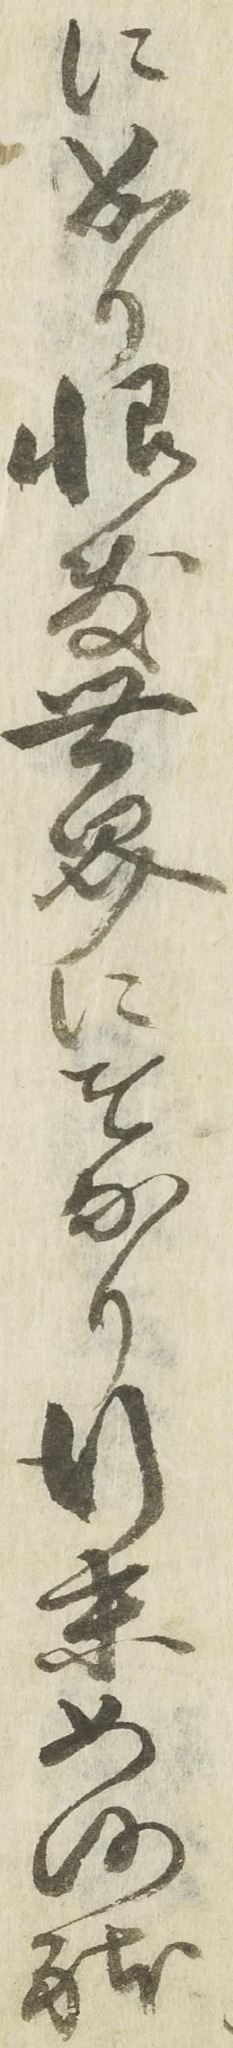に成り恨敷世界にそなり行末如何躰
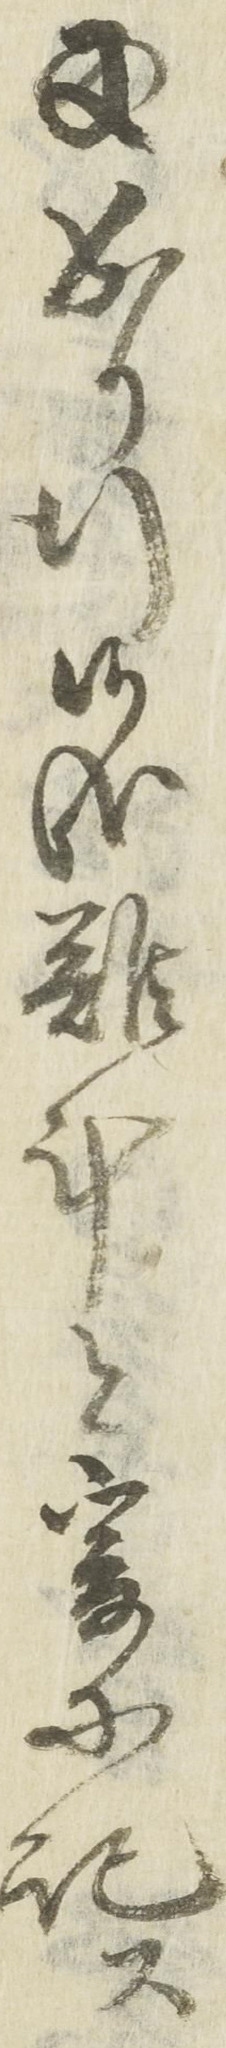に成り行候哉難計と爰に記ス
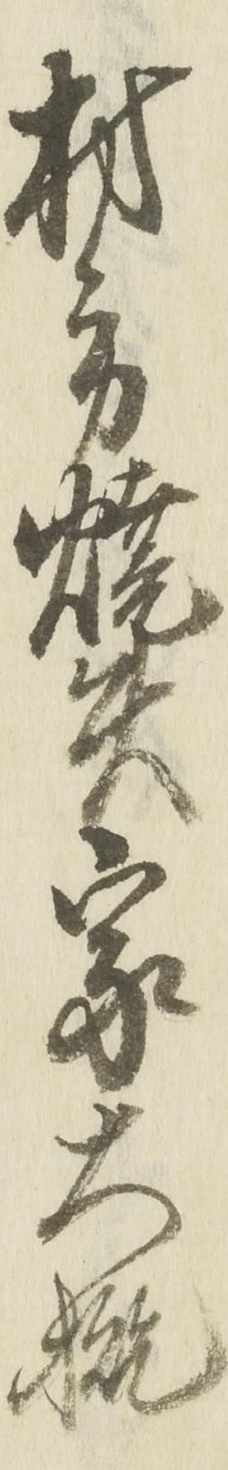村方焼失家大概
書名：後見笑
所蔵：東京大学地震研究所図書室 Earthquake Research Institute Library, The University of Tokyo, JAPAN
